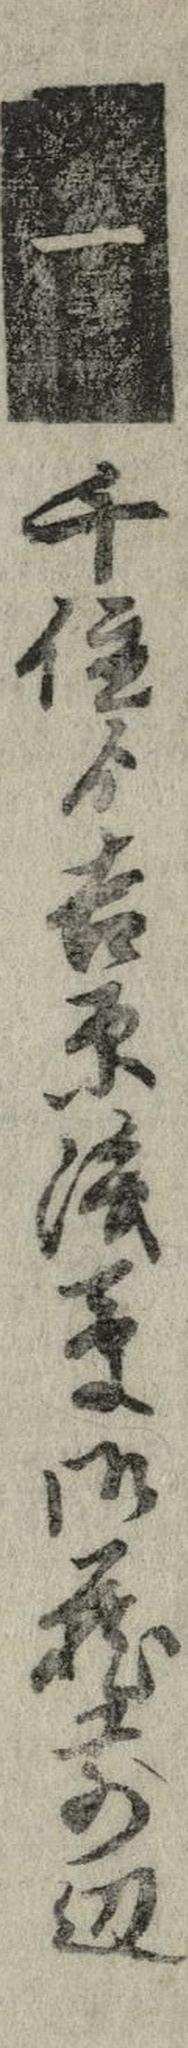一千住ゟ吉原浅草御蔵前辺
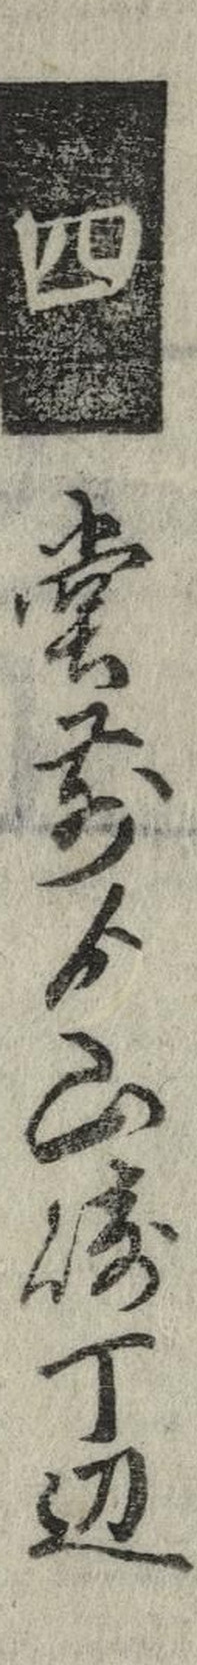四堂前ゟ山崎丁辺
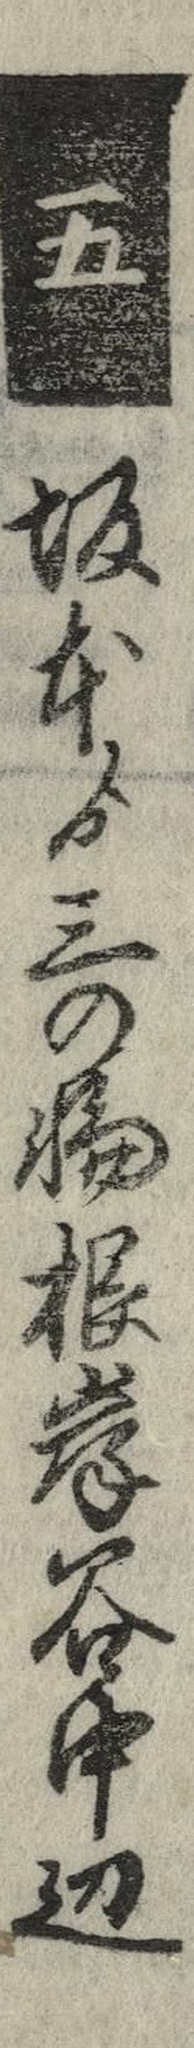五坂本ゟ三の輪根岸谷中辺
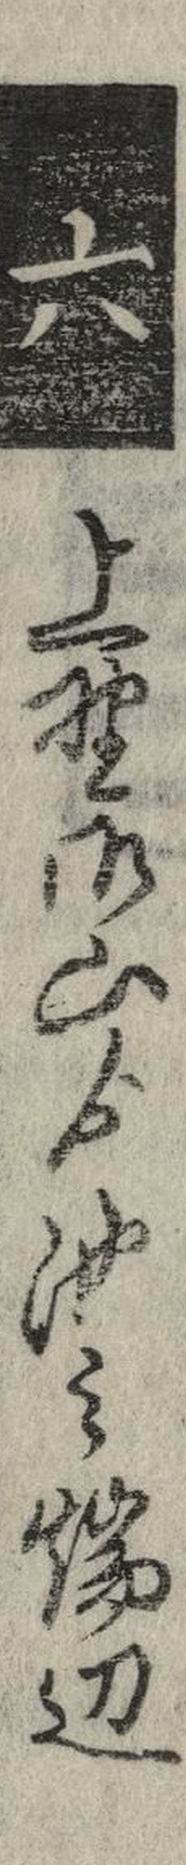六上野御山ゟ池之端辺
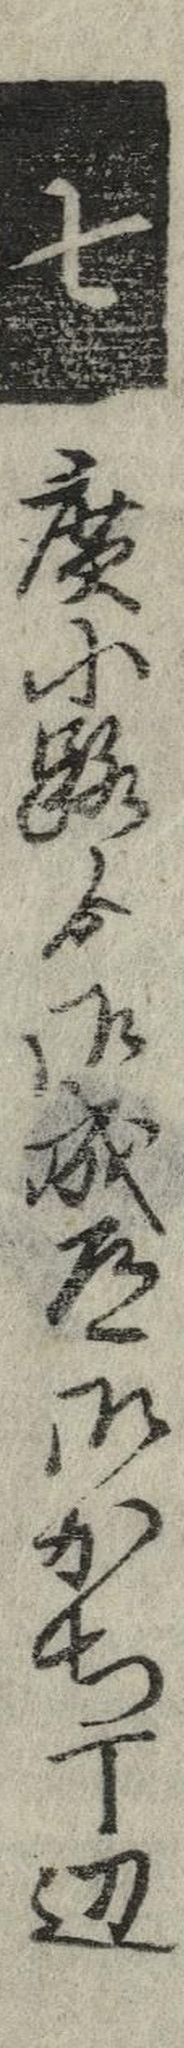七広小路ゟ御成道御かち丁辺
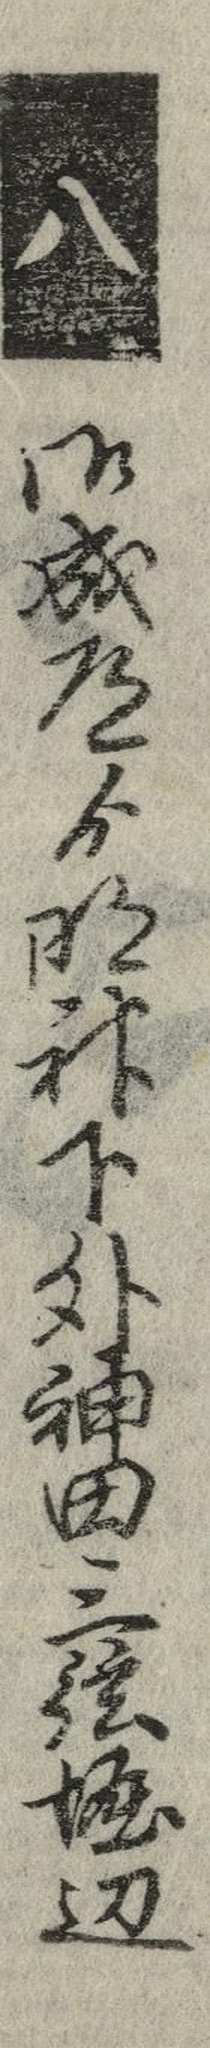八御成道ゟ明神下外神田三弦堀辺
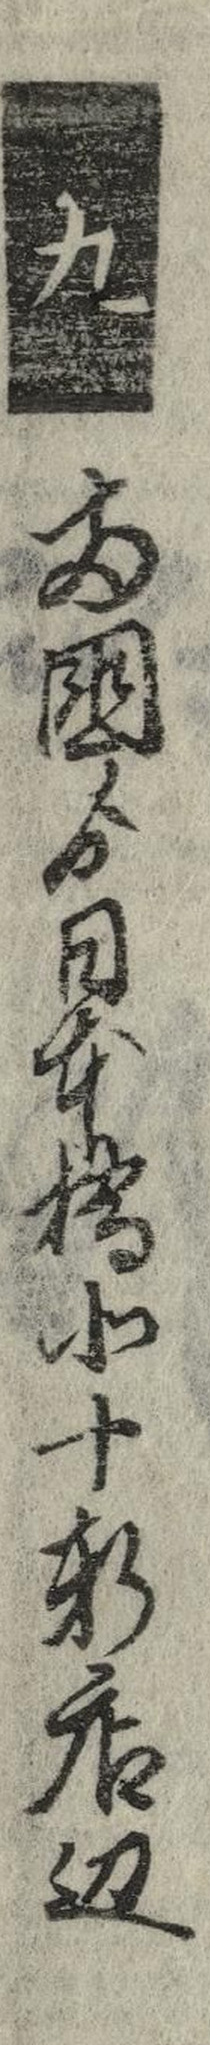九両国ゟ日本橋北十軒店辺
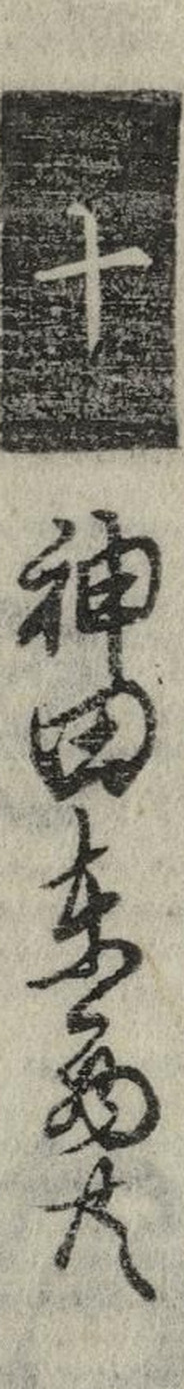十神田東西共
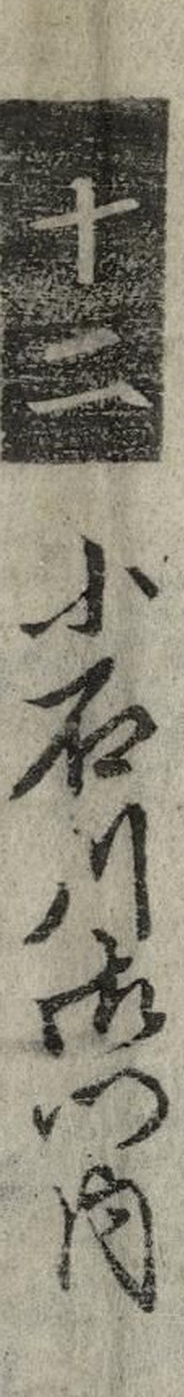十二小石川御門内
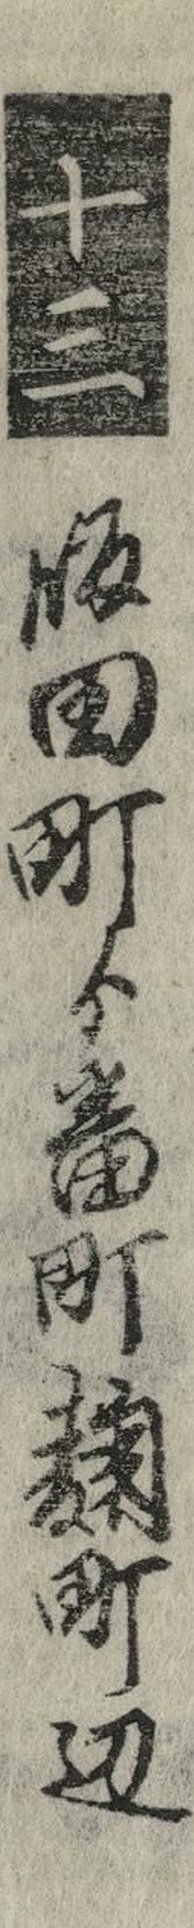十三飯田町ゟ番町麹町辺
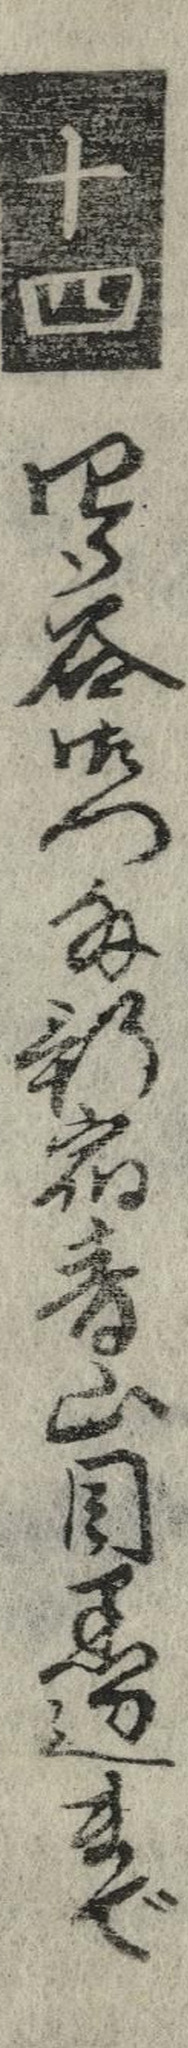十四四ツ谷御門外新宿青山目黒辺まで
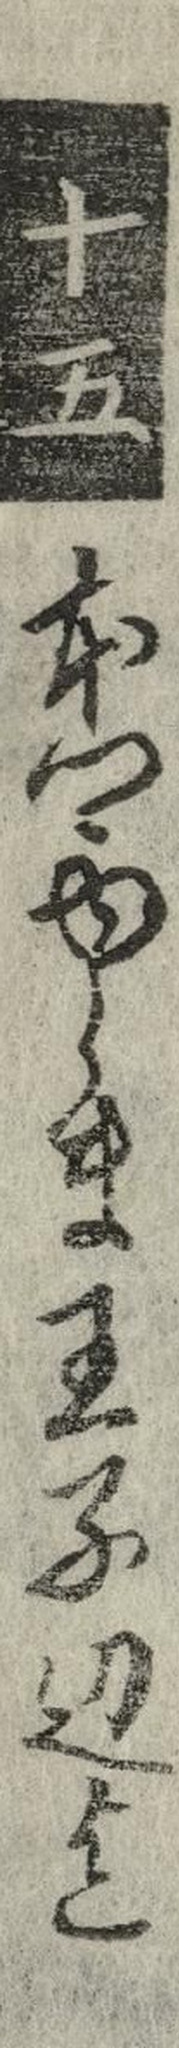十五本郷ゆしま王子辺迄
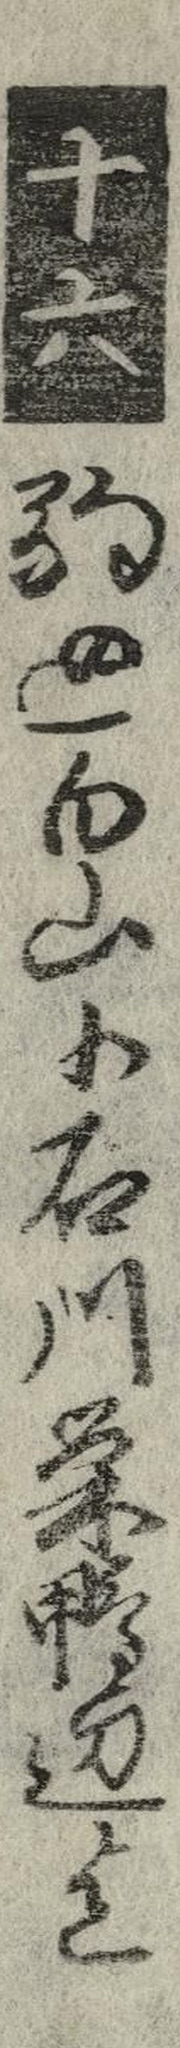十六駒込白山小石川巣鴨辺迄
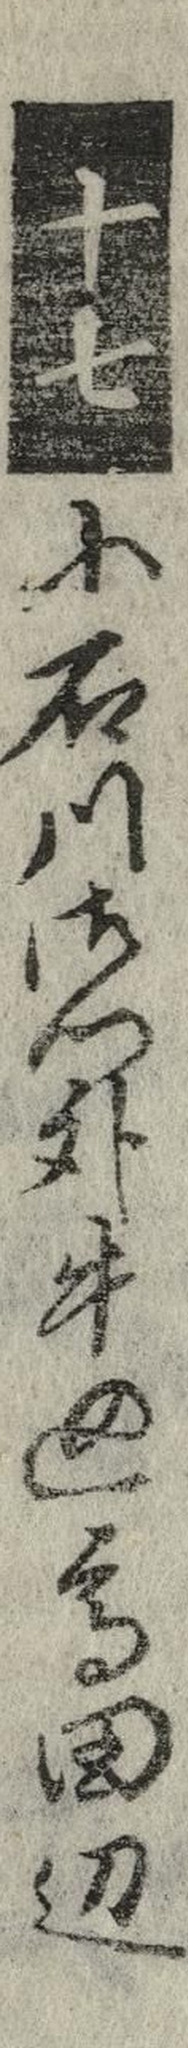十七小石川御門外牛込高田辺
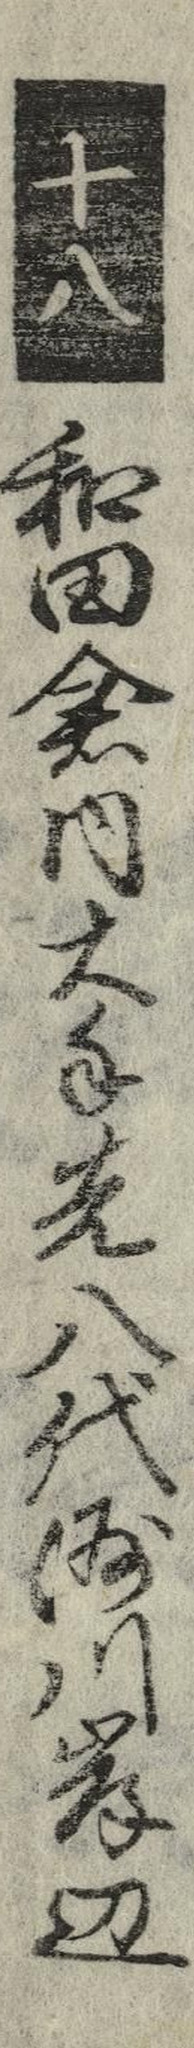十八和田倉内大手先八代洲川岸辺
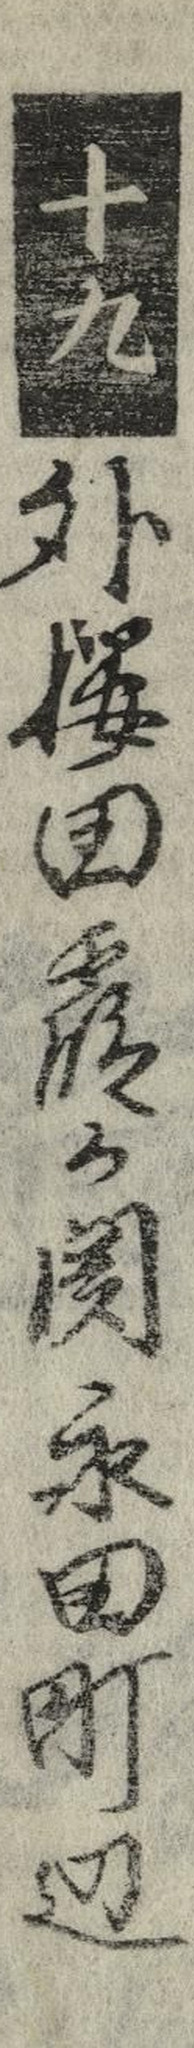十九外桜田霞ヶ関永田町辺
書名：地震類焼場所明細書之写　安政二卯年十月二日夜四ツ時過　御府内御屋敷方市中共、并街道筋近郷聞書
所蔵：東京大学地震研究所図書室 Earthquake Research Institute Library, The University of Tokyo, JAPAN
